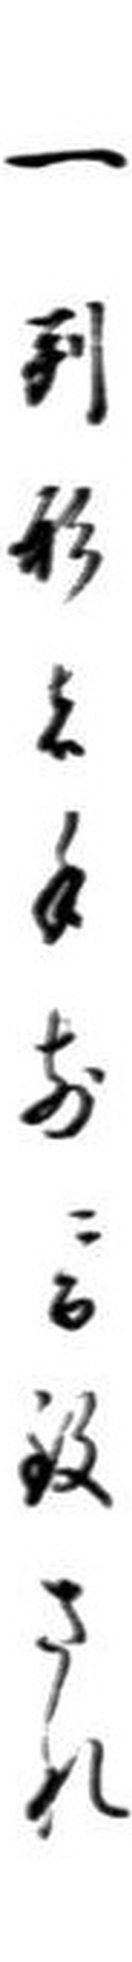一判形者手前ニ而致され

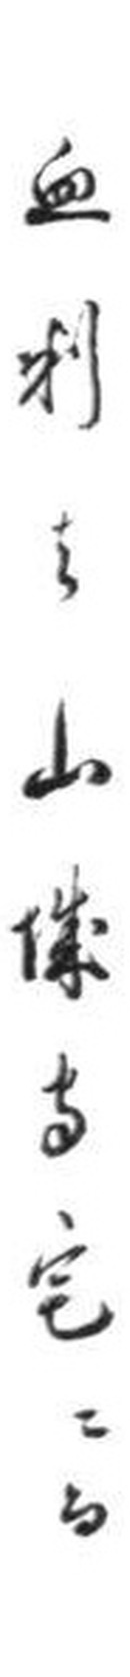血刺者山城守宅ニ而
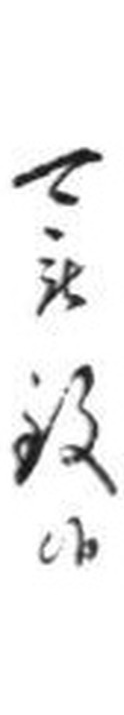可被致候
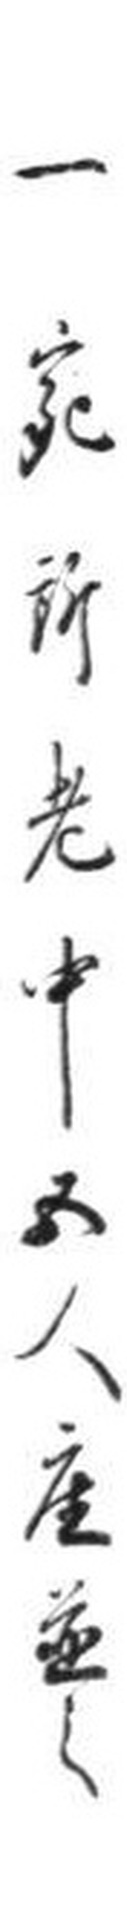一宛所老中五人座並之
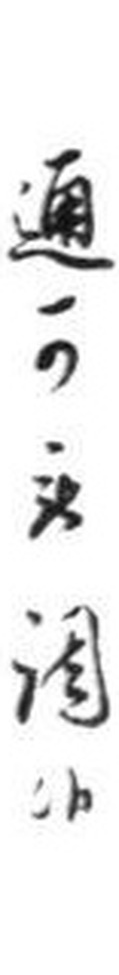通可被調候
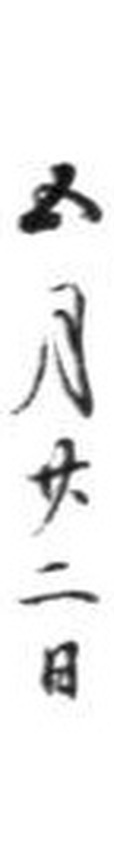五月廿二日
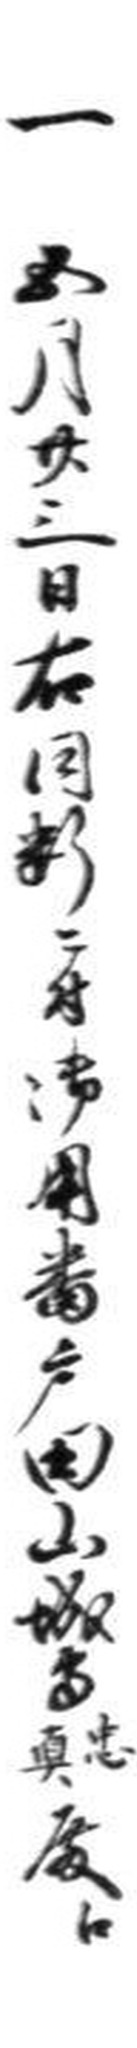一五月廿三日右同断ニ付御用番戸田山城守忠真殿江
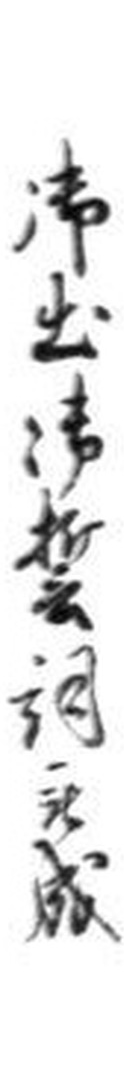御出御誓詞被成
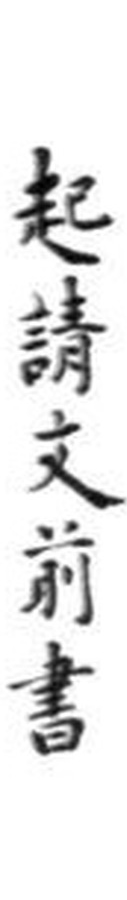起請文前書
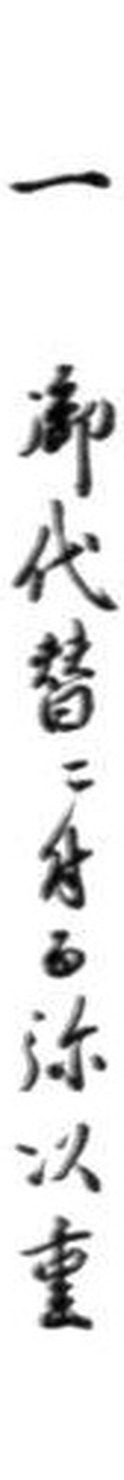一御代替ニ付而弥以重
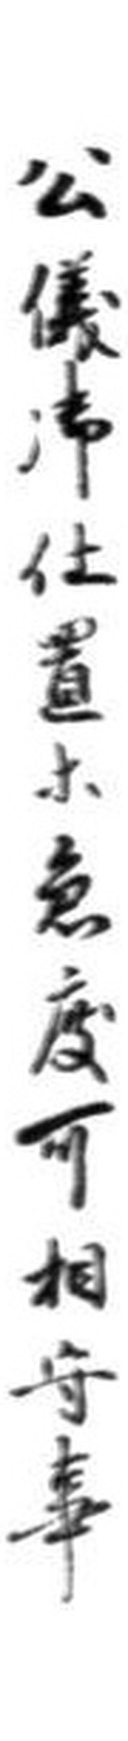公儀御仕置等急度可相守事
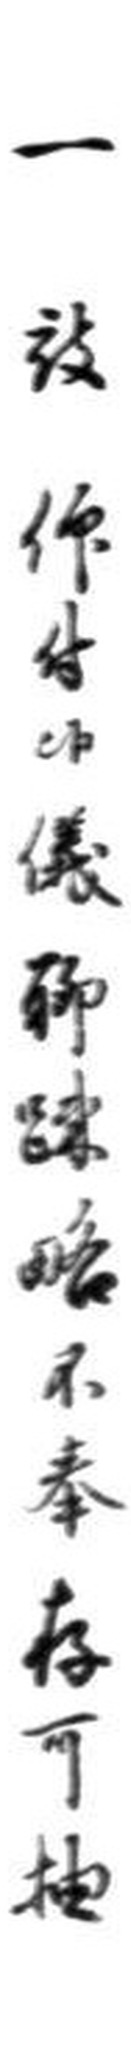一被仰付候儀聊疎略不奉存可抽
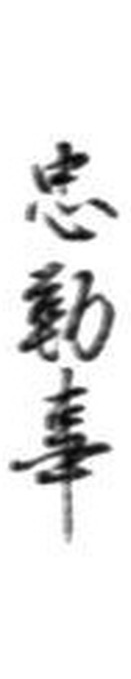忠勤事
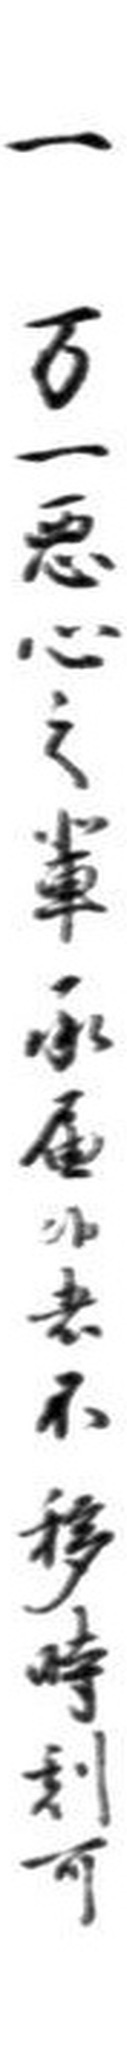一万一悪心之輩承届候者不移時刻可
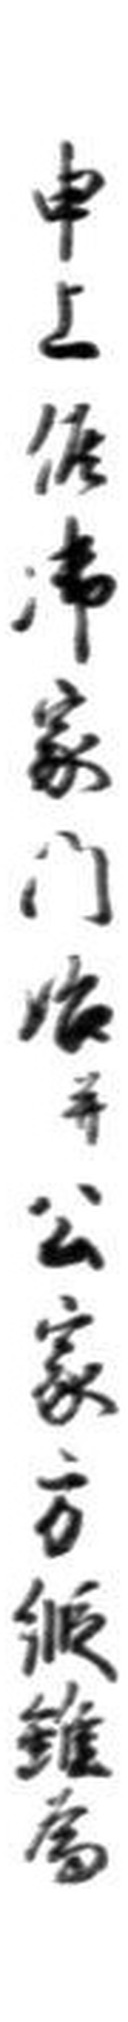申上候御家門始并公家方縦雖為
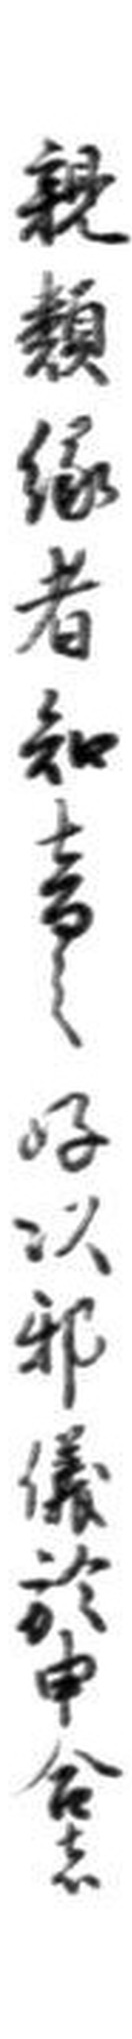親類縁者知音之好以邪儀於申合者
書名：家譜 三十一 吉邦公 享保元年
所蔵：福井県文書館 Fukui Prefectural Archives
